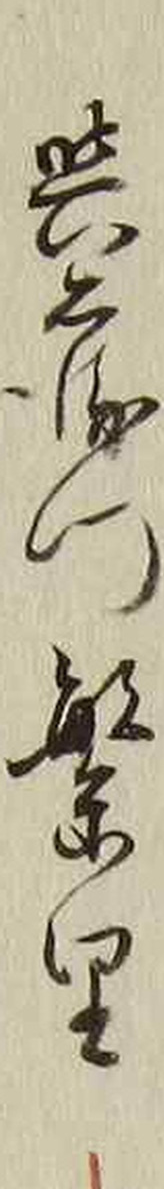浅右衛門繁元
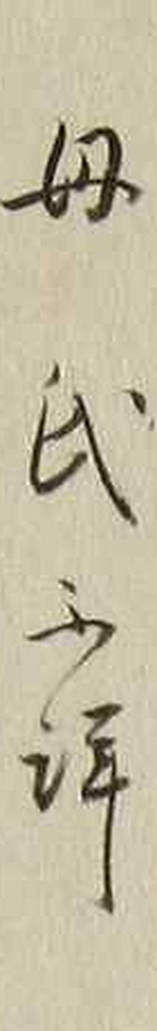母氏不詳
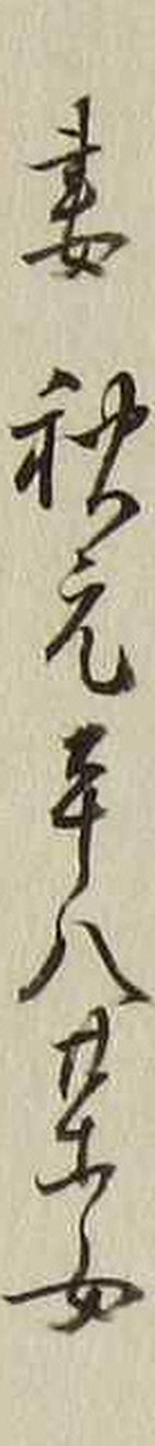妻秋元平八某女
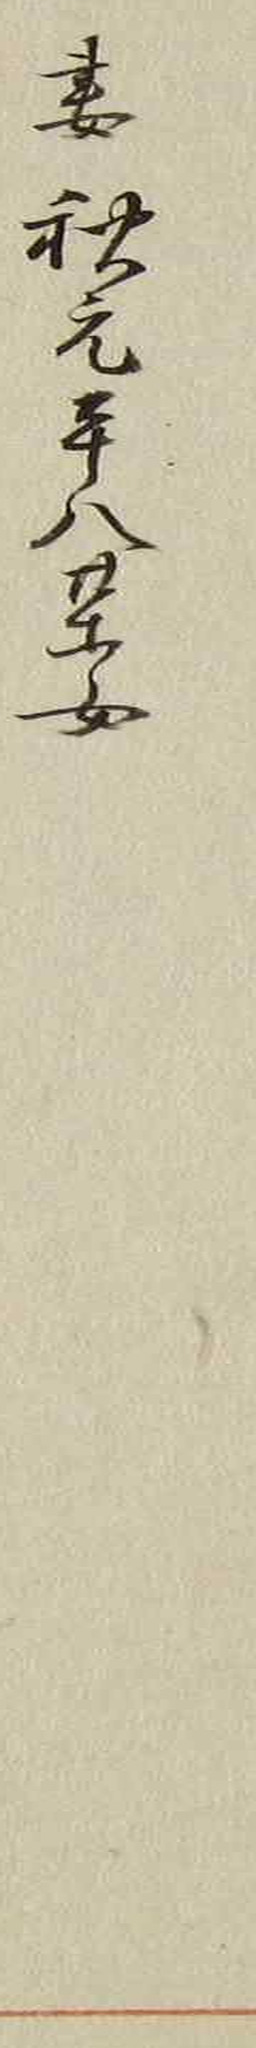妻秋元平八某女
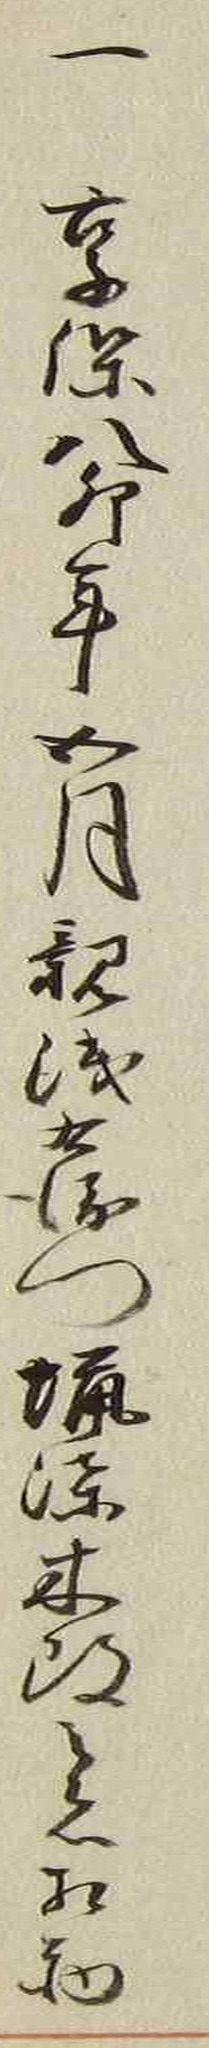一享保八卯年五月親浅右衛門蝋漆木改之者相勤
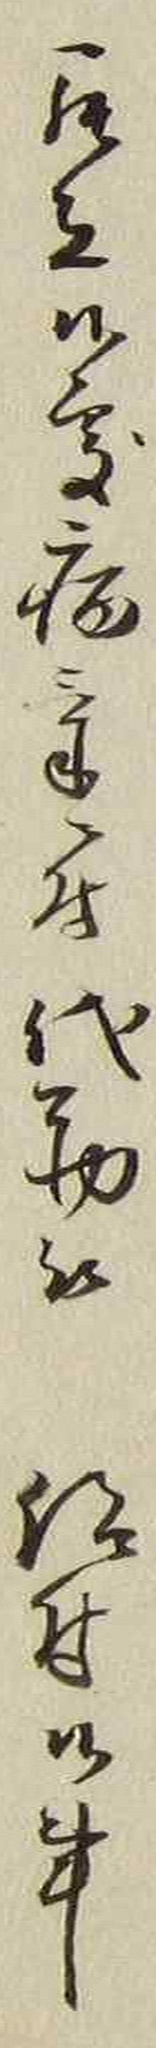罷在候処病気ニ付代勤被仰付候事

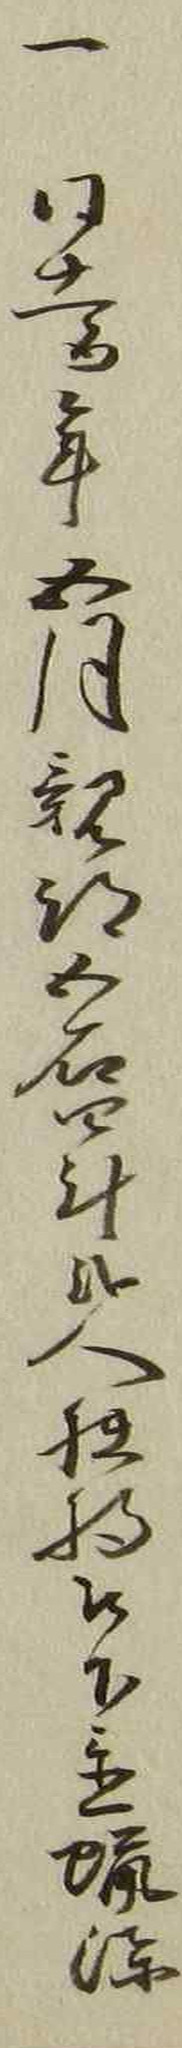一同十一酉年五月親跡五石四斗弐人扶持被下置蝋漆
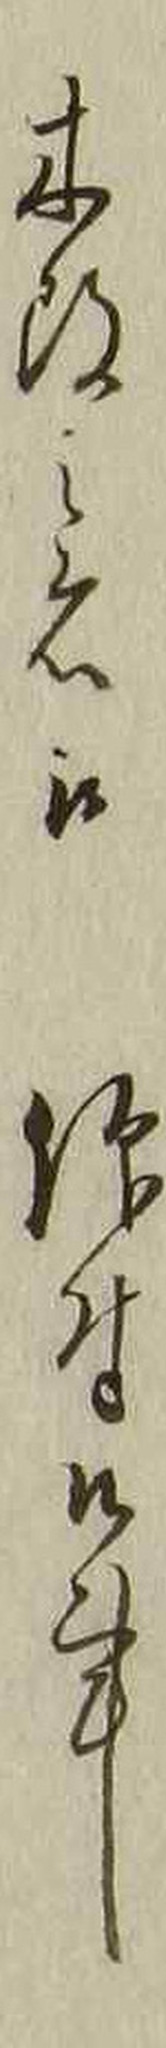木改之者被仰付候事
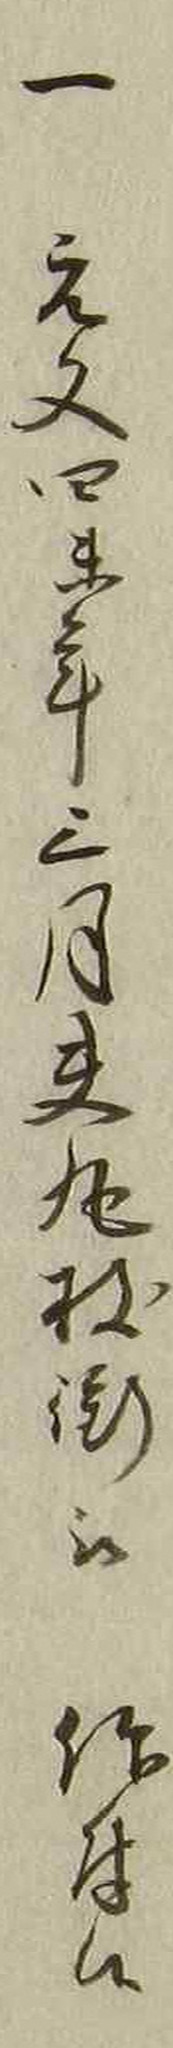一元文四未年三月夫丸枝衝被仰付候
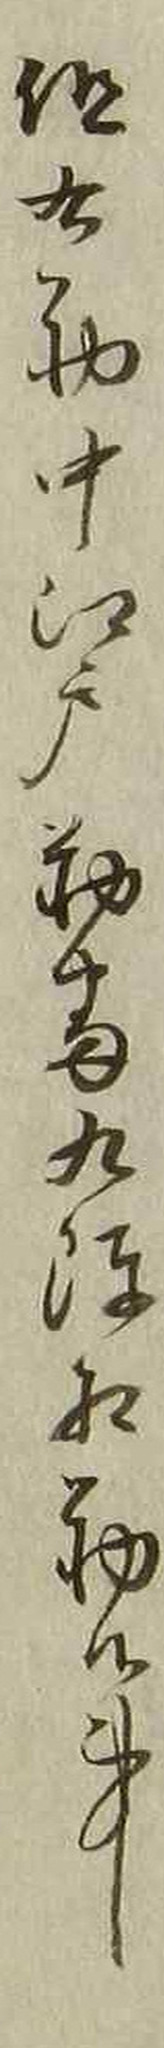但右勤中江戸勤番九陣相勤候事
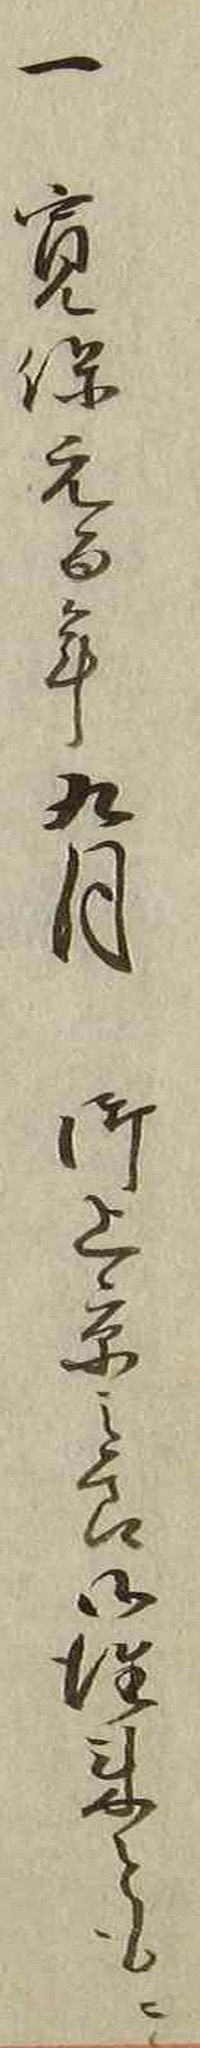一寛保元酉年九月御上京之節御往来ともニ
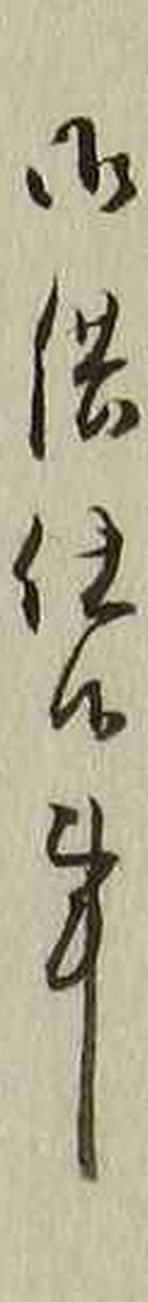御供仕候事
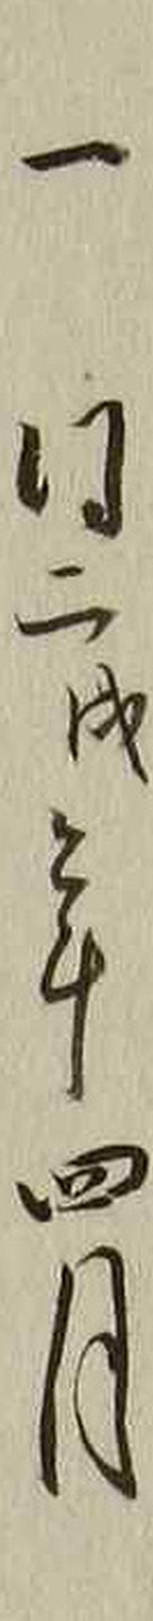一同二戌年四月
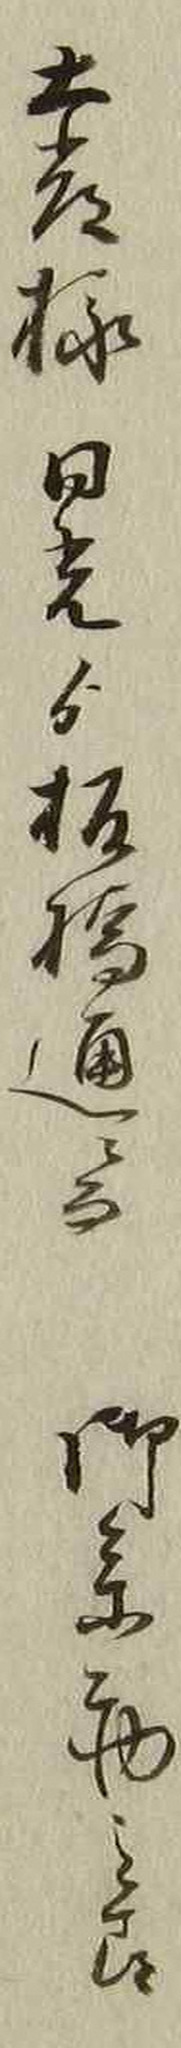土常様日光ゟ板橋通ニ而御参勤之節
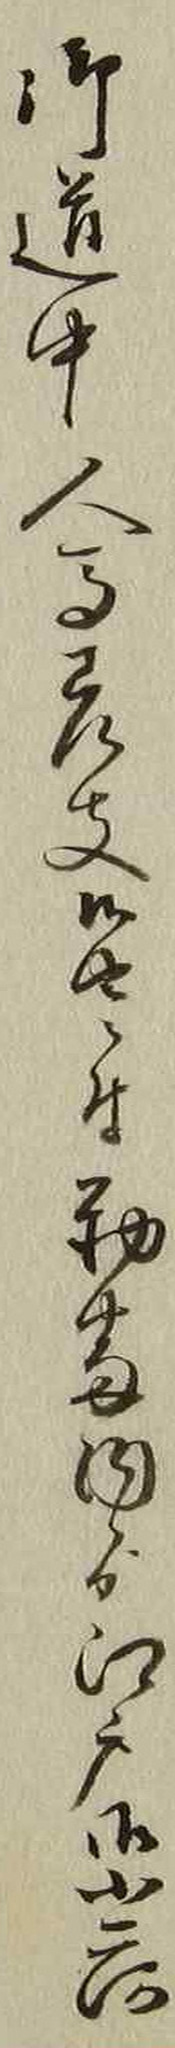御道中人馬差支候由ニ付勤番内ゟ江戸御小荷
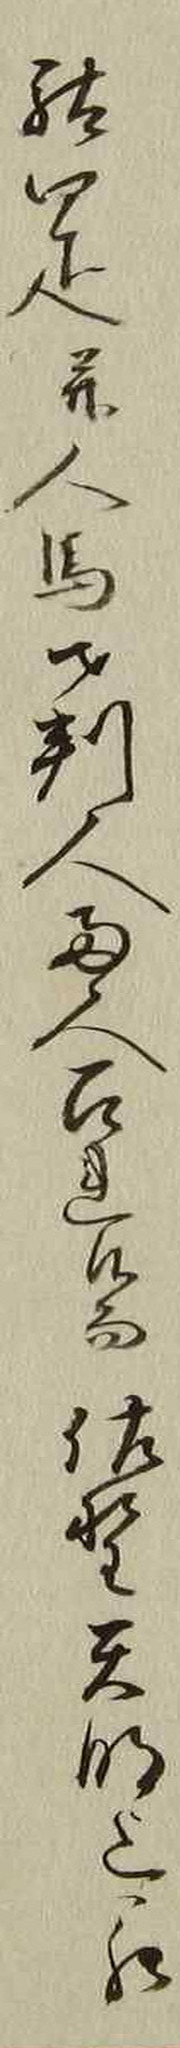駄四疋幷人馬才判人両人召連候而佐野天明迄罷
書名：諸士系譜　巻之32　い之部32
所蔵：会津若松市立会津図書館
